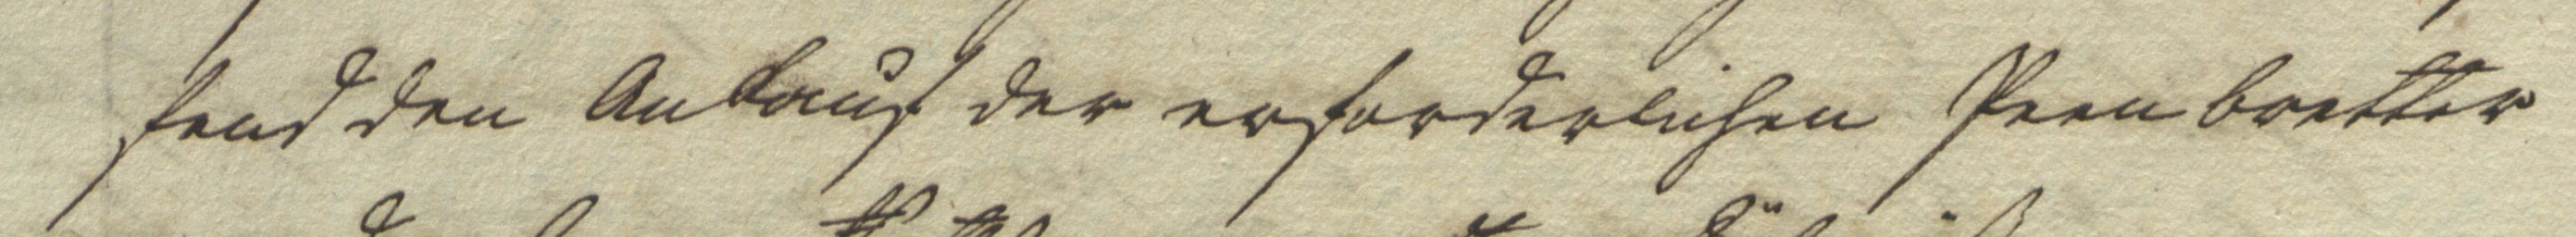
fend den Ankauf der erforderlichen Peenbretter
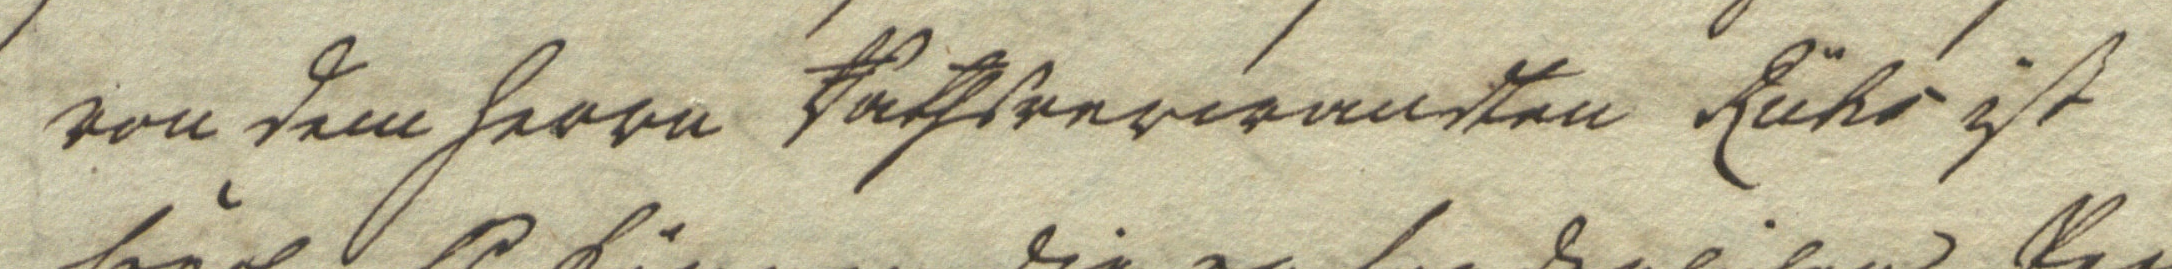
von dem Herrn Rathsverwandten Rühs ist
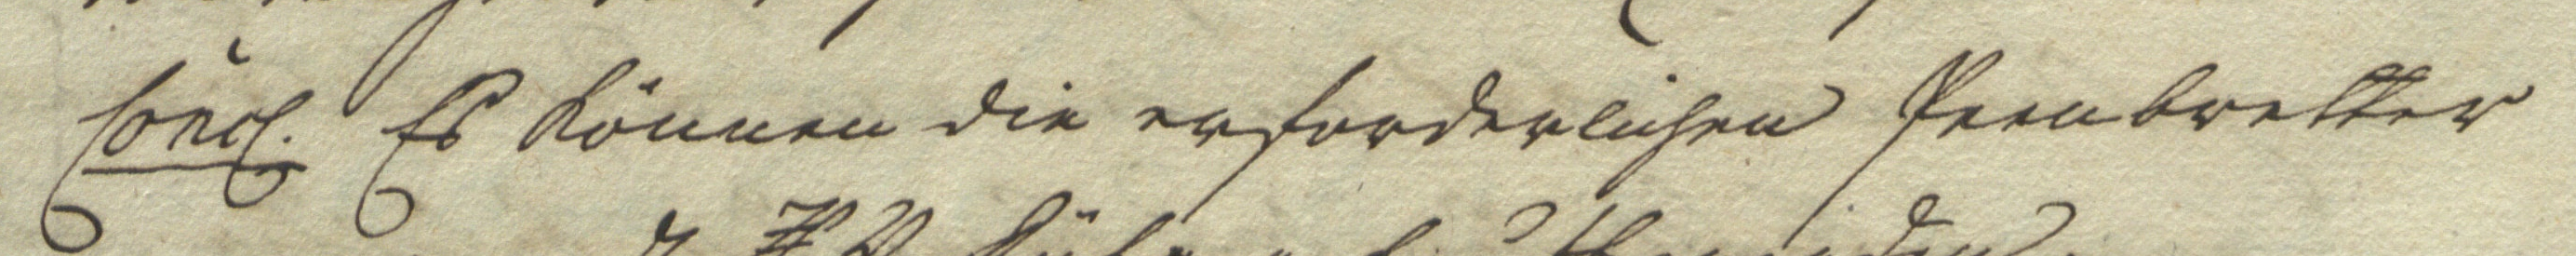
Concl. Es können die erforderlichen Peenbretter
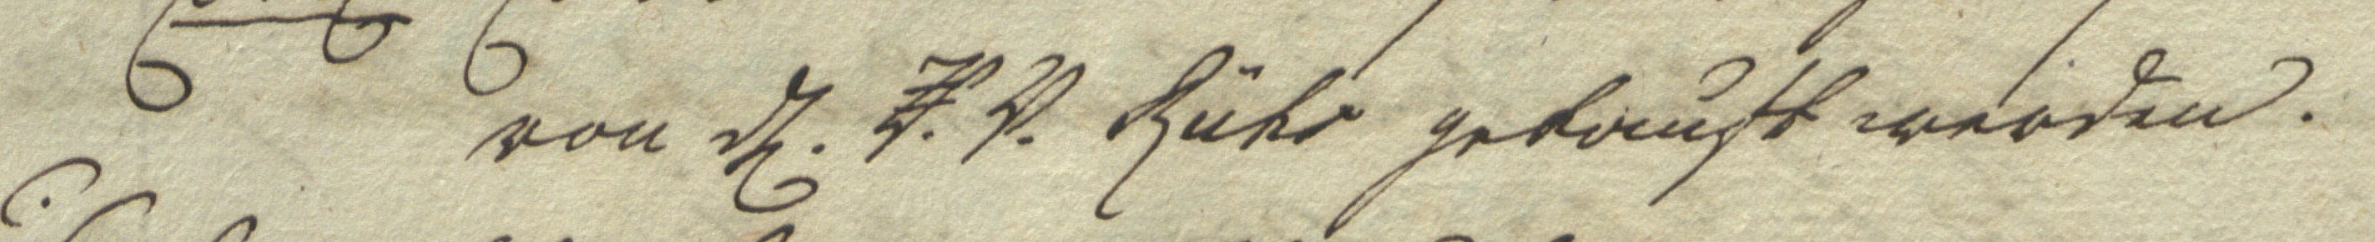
von dh. R. V. Rühs gekauft werden.
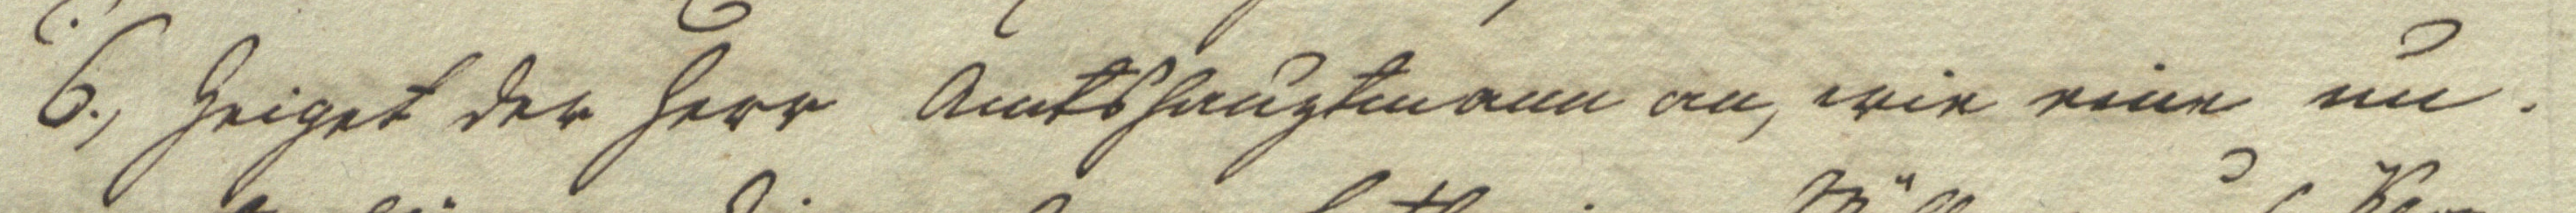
6., Zeiget der Herr Amtshauptmann an, wie eine un¬
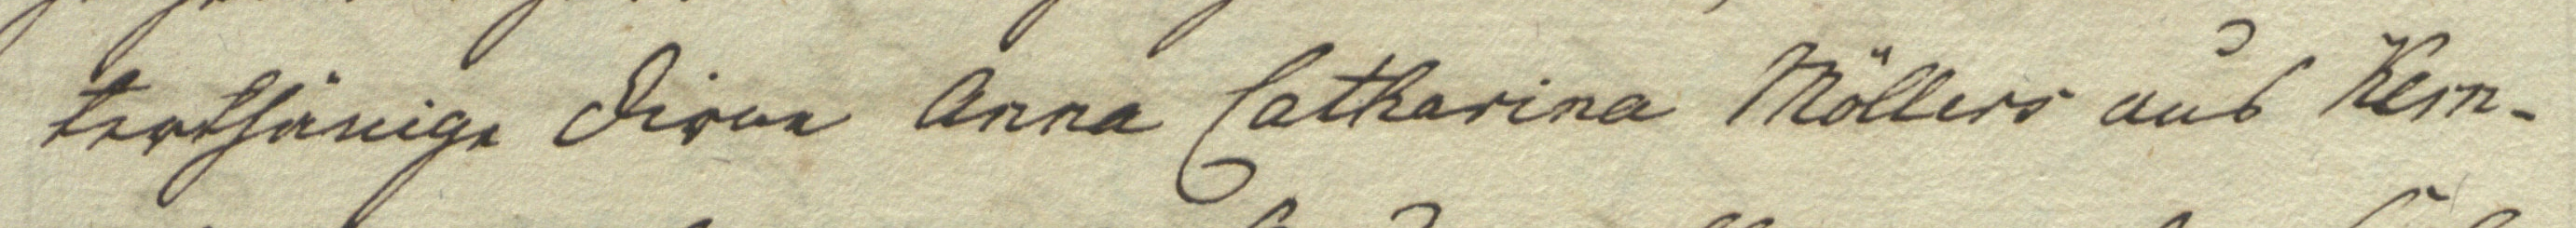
terthänige Dirne Anna Catharina Möllers aus Kem¬
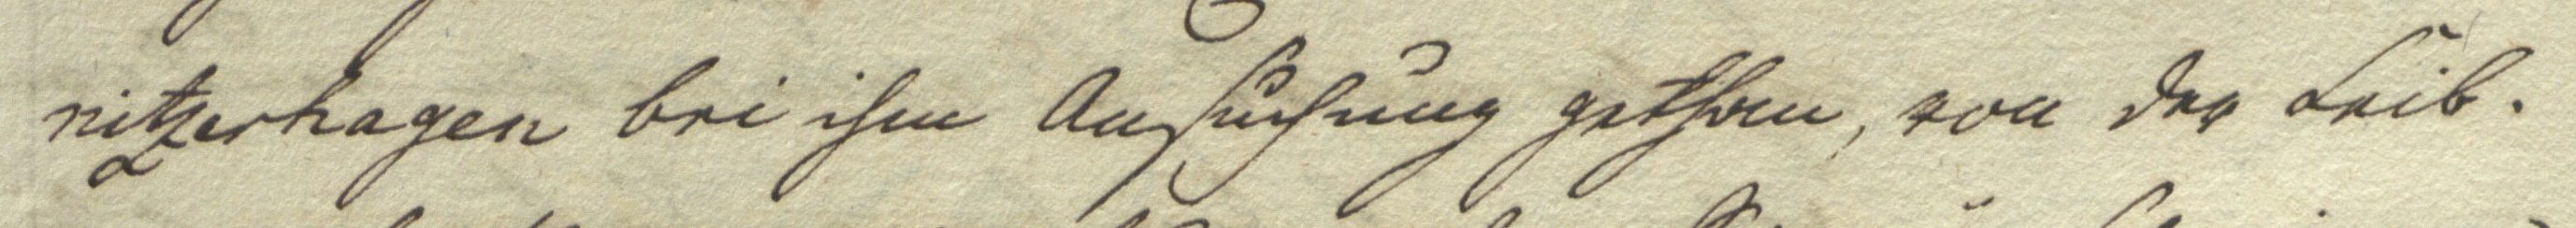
nitzerhagen bei ihm Ansuchung gethan, von der Leib¬
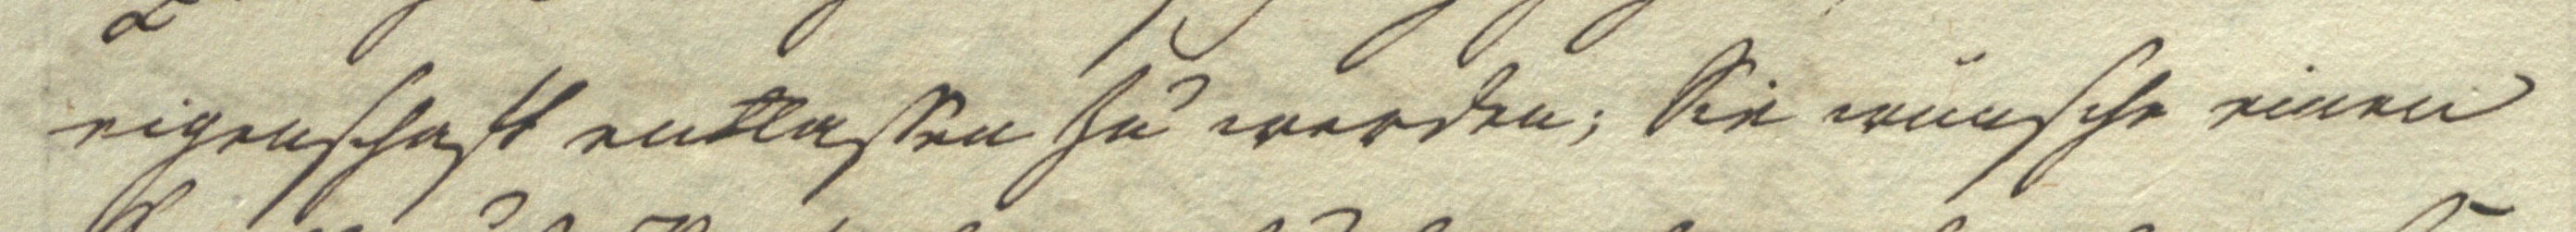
eigenschaft entlassen zu werden; Sie wünsche einen
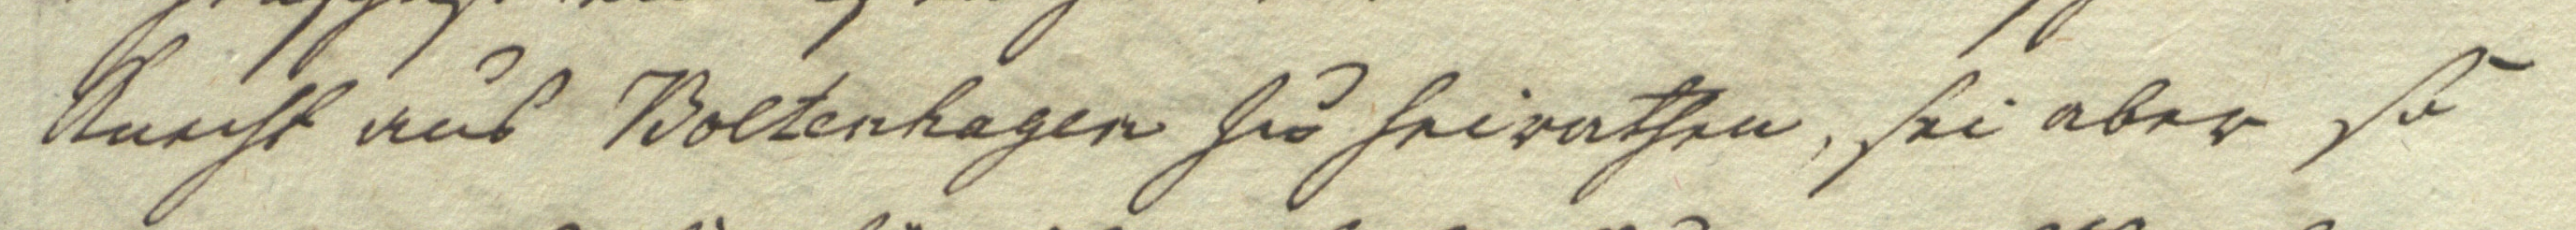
Knecht aus Boltenhagen zu heirathen, sei aber so
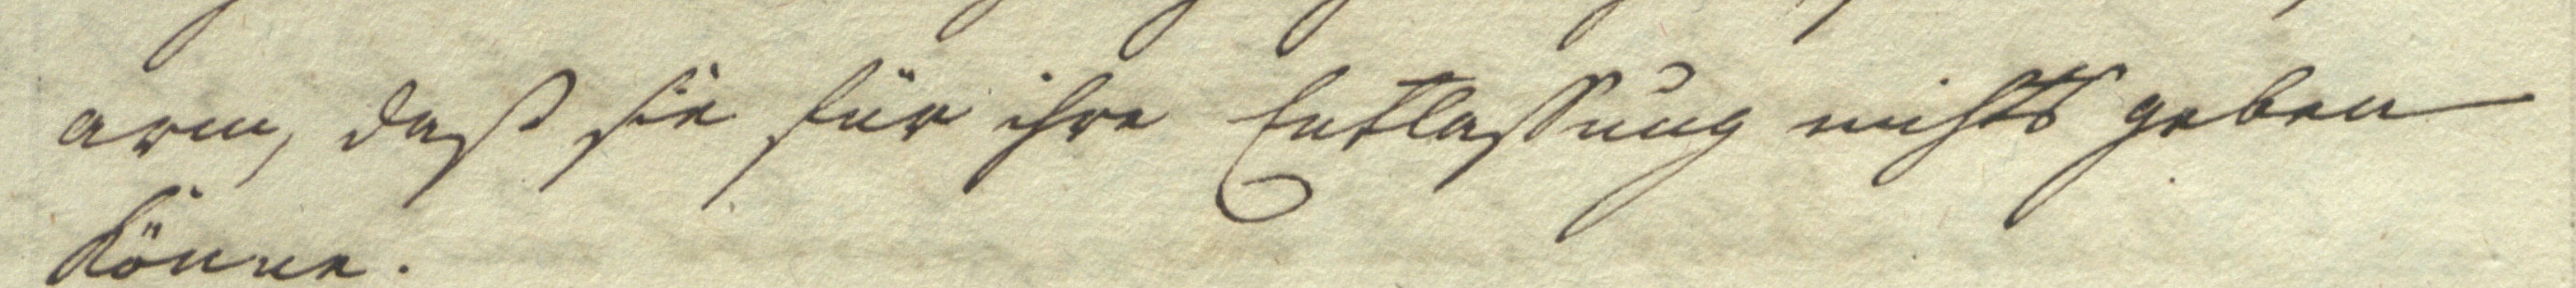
arm, daß sie für ihre Entlassung nichts geben
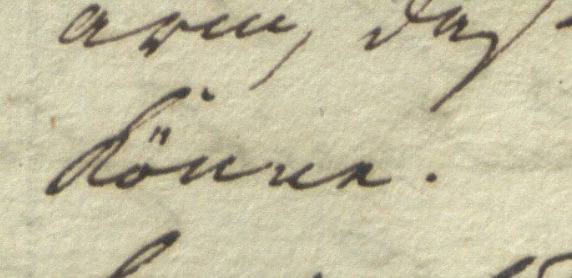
könne.
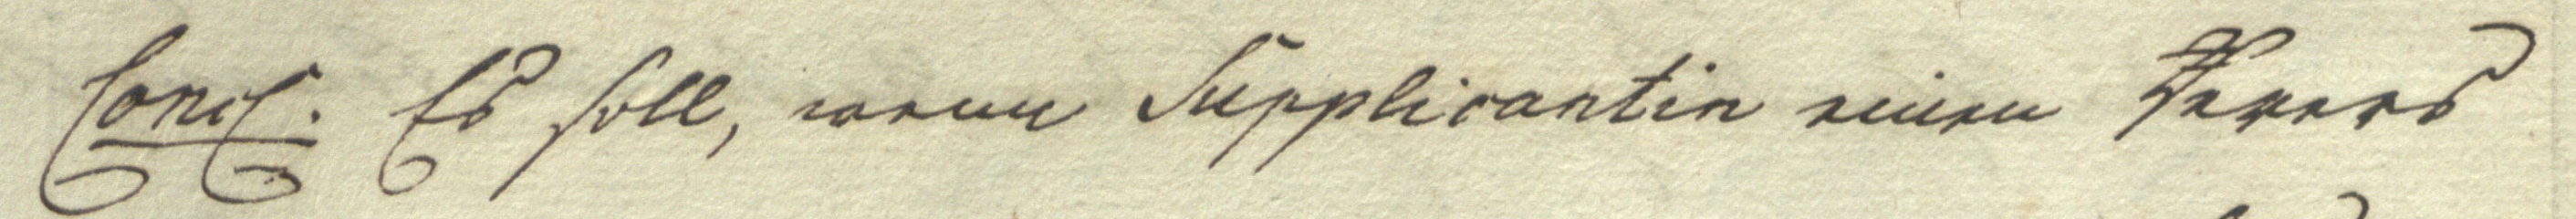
Concl. Es soll, wenn Supplicantin einen Revers
